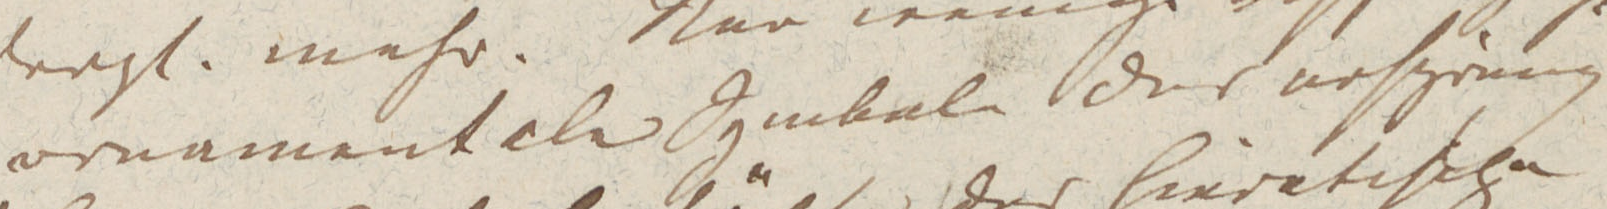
ornamentale Symbole der ursprüng
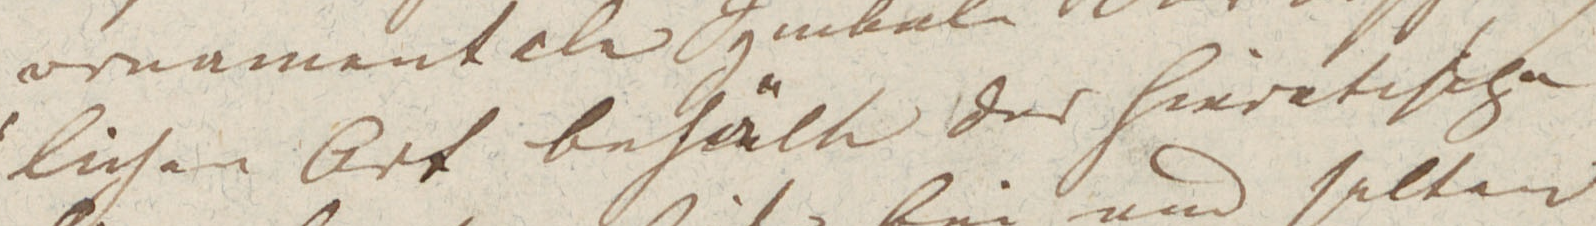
lichen Art behält der hieratische
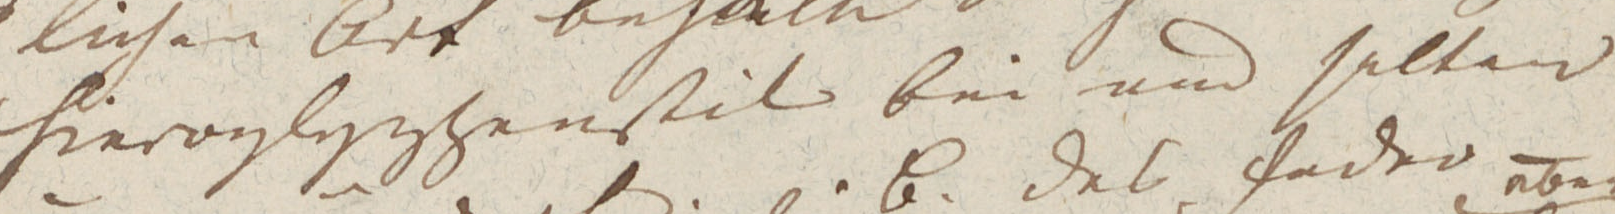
Hieroglyphenstil bei und selten
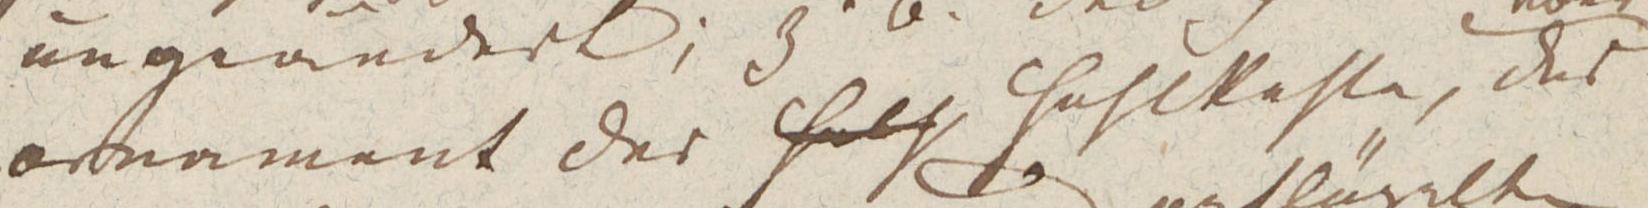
onrament der Holh Hohlkehle, das
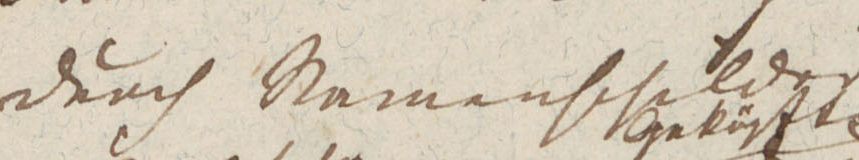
durch Namenschilder
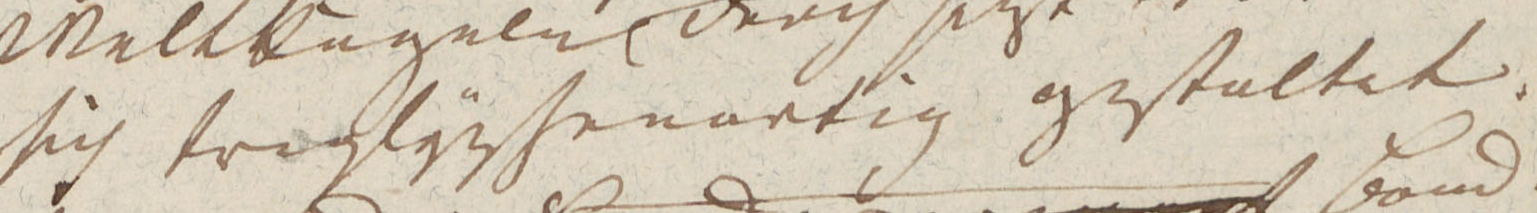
sich triglyphenartig gestaltet.
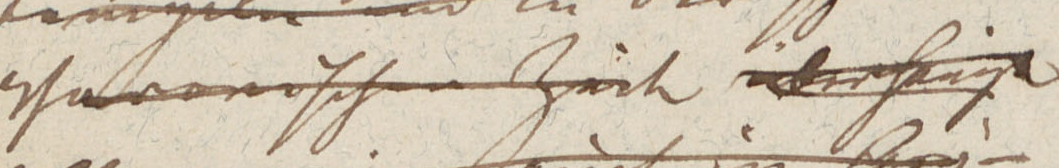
pharonischen Zeit überhaupt
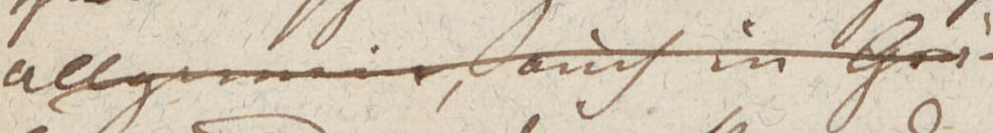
allgemein, auch in Grä-
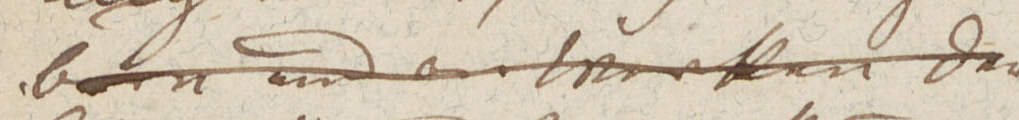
bern und in Wirken der
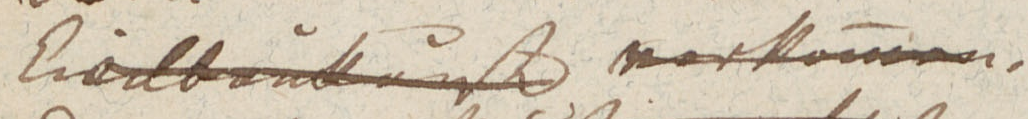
Civilbaukunst vorkommen.
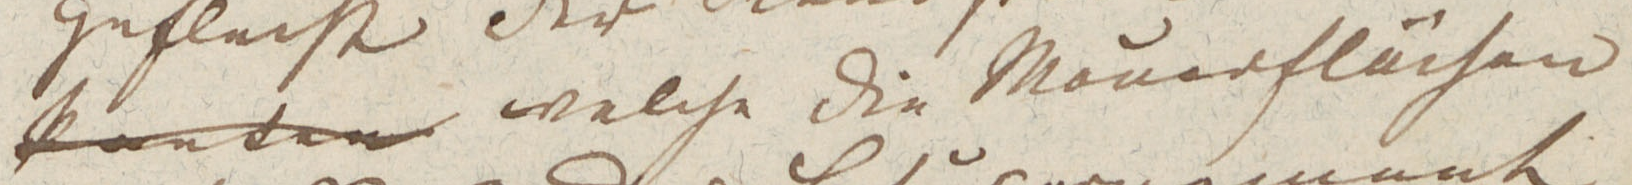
kanten welche die Mauerflächen
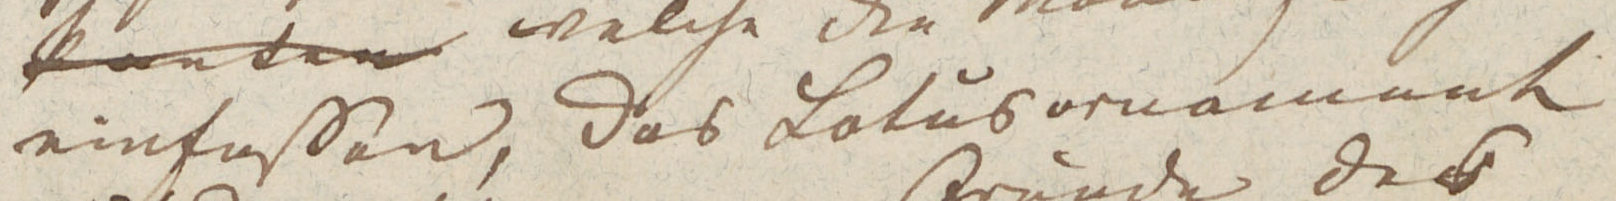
einfassen, das Lotusornament
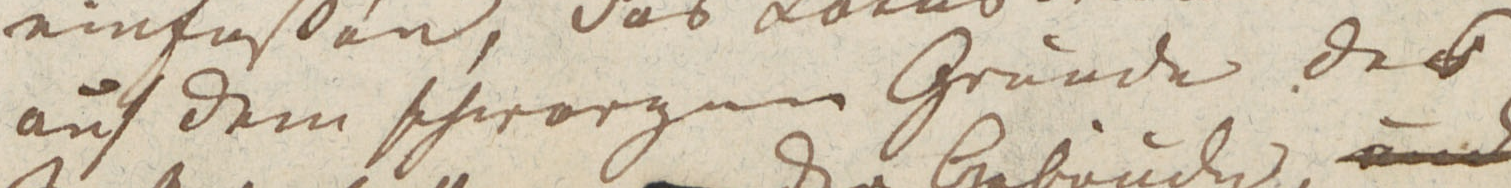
auf dem schwarzen Grunde desr
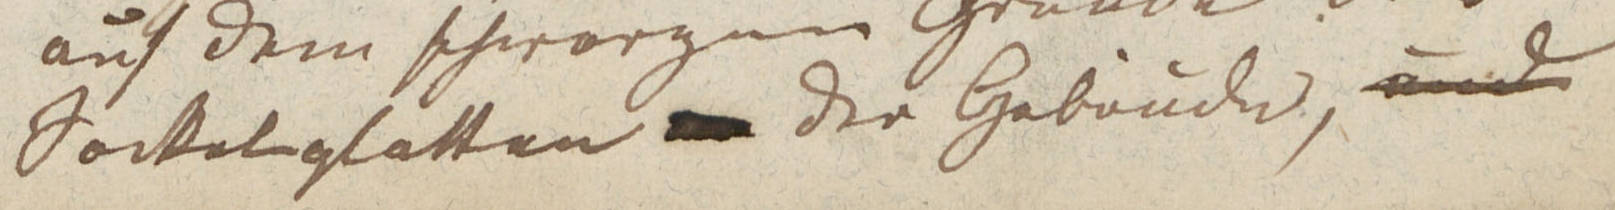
Sockelplatten der Gebäude, und
